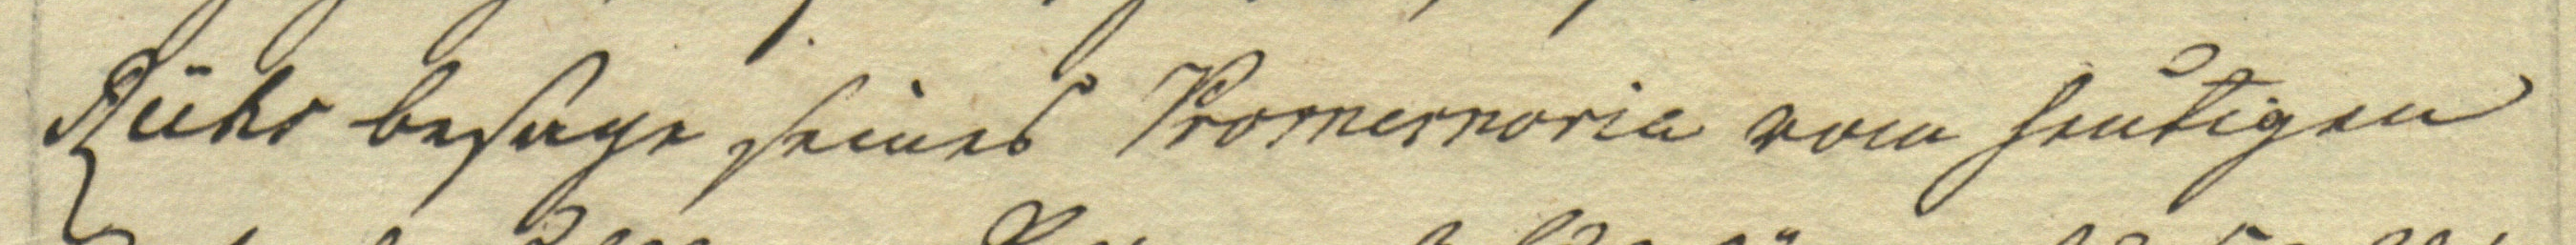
Rühs besage seines Promemoria vom heutigen
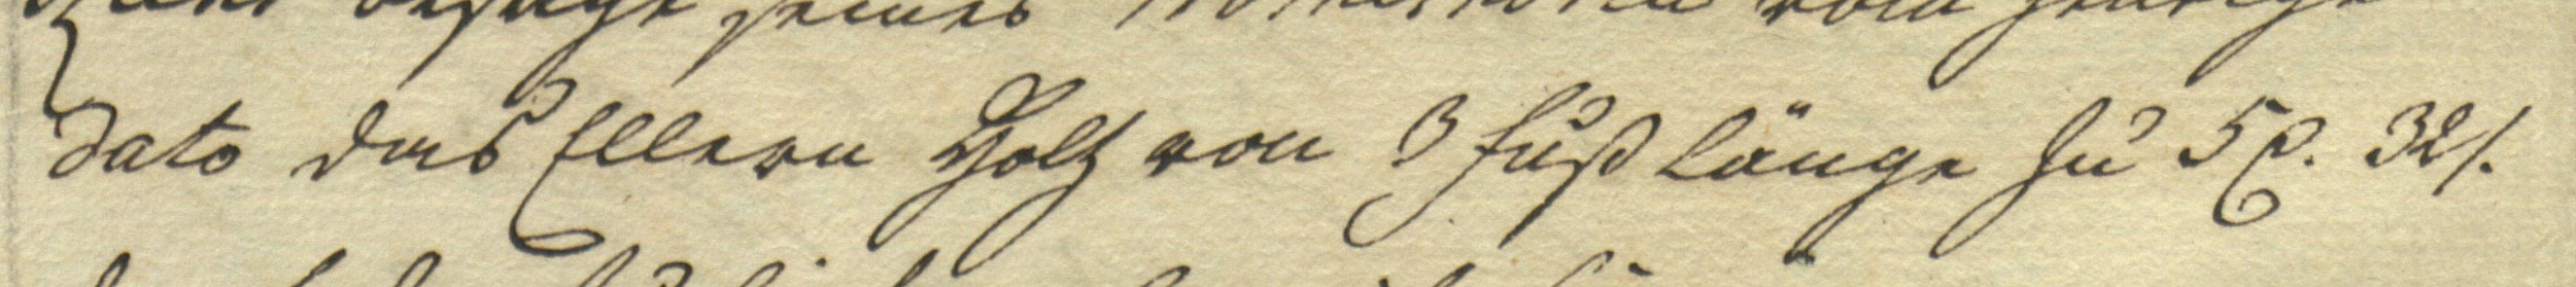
dato das Ellern Holz von 3 Fuß Länge zu 5 l. 32 s.
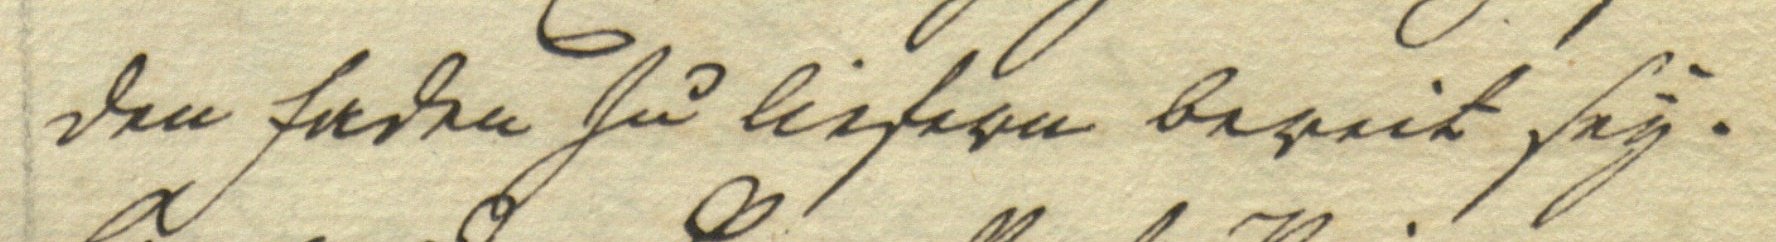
den Faden zu liefern bereit seÿ.
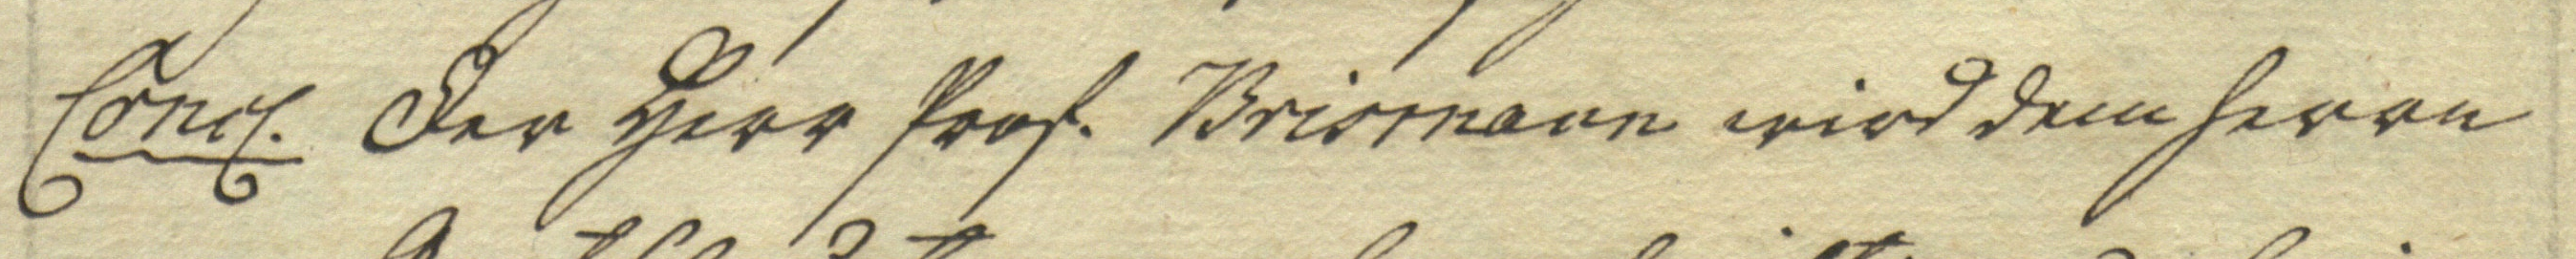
Concl. Der Herr Prof. Brismann wird dem Herrn
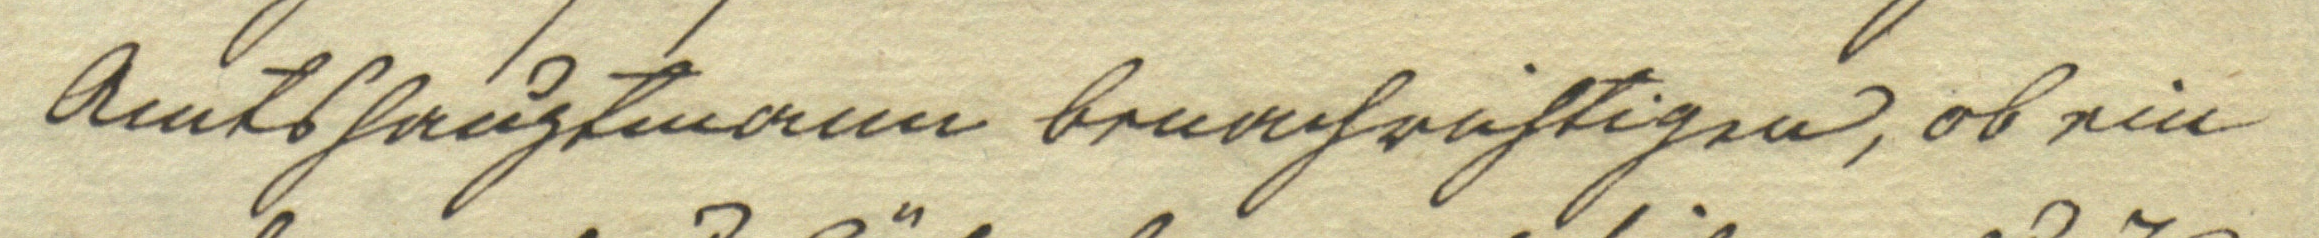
Amtshauptmann benachrichtigen, ob ein
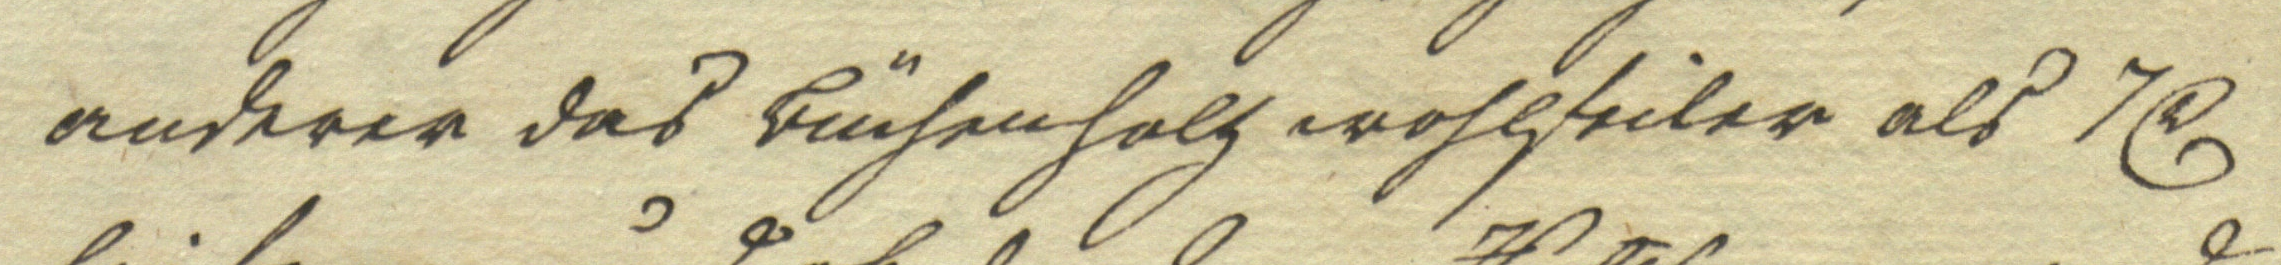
anderer das Büchenholz wohlfeiler als 7 l.
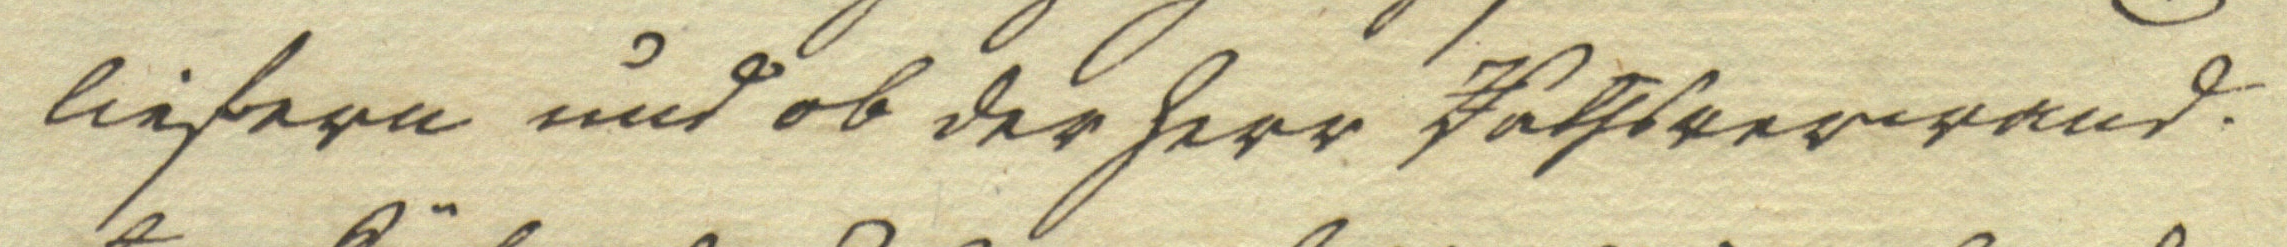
liefern und ob der Herr Rathsverwand¬
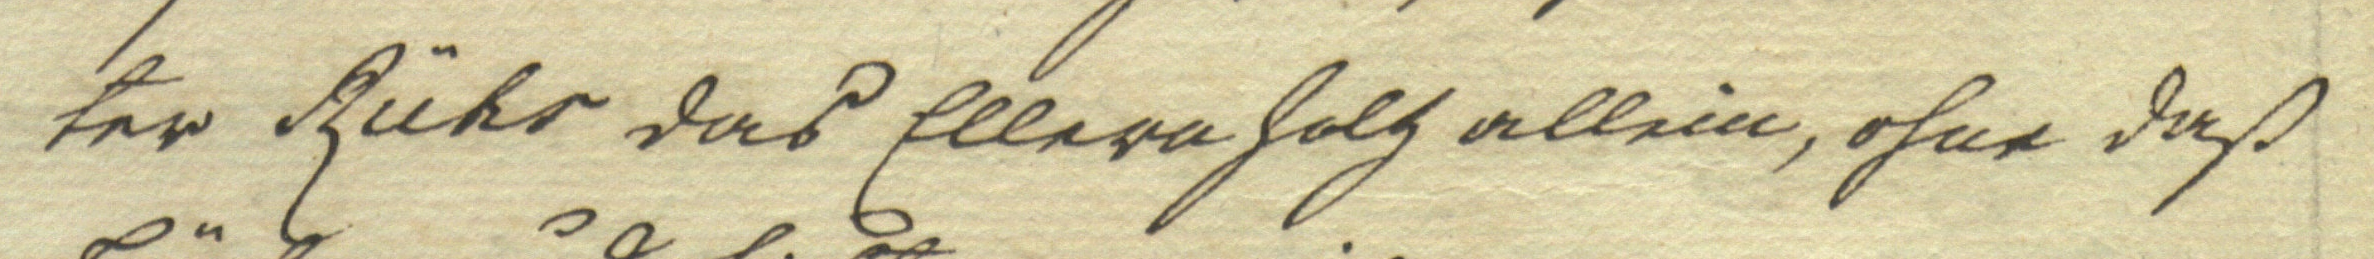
ter Rühs das Ellern Holz allein, ohne daß
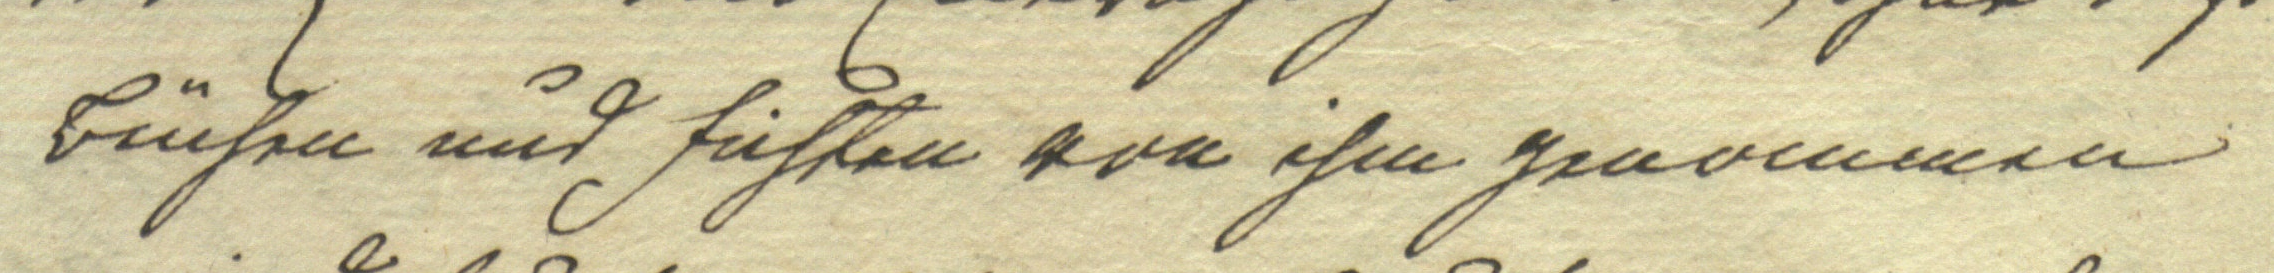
Büchen und Fichten von ihm genommen
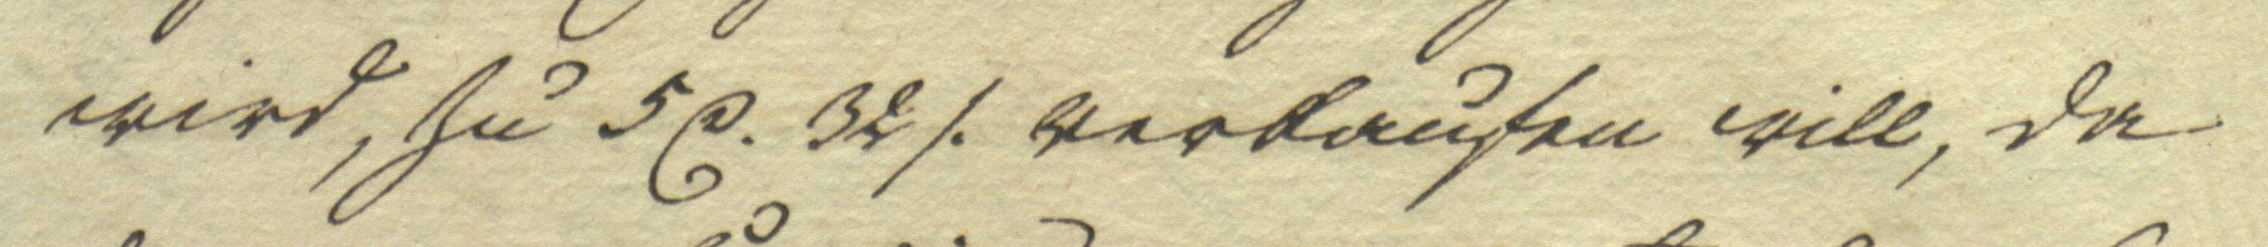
wird, zu 5 l. 32 s. verkaufen will, da
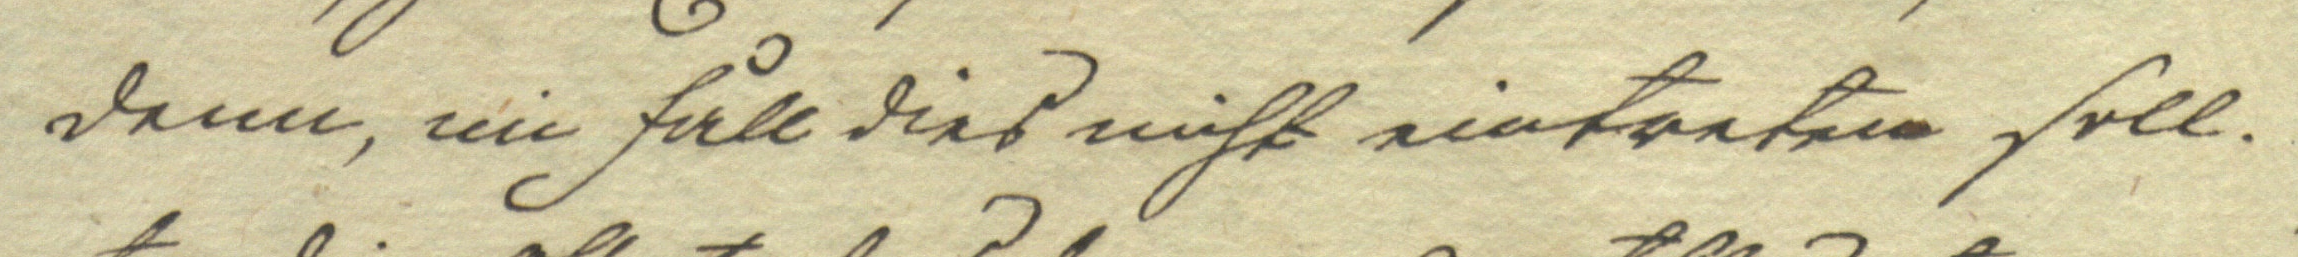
denn, im Fall dies nicht eintreten soll¬
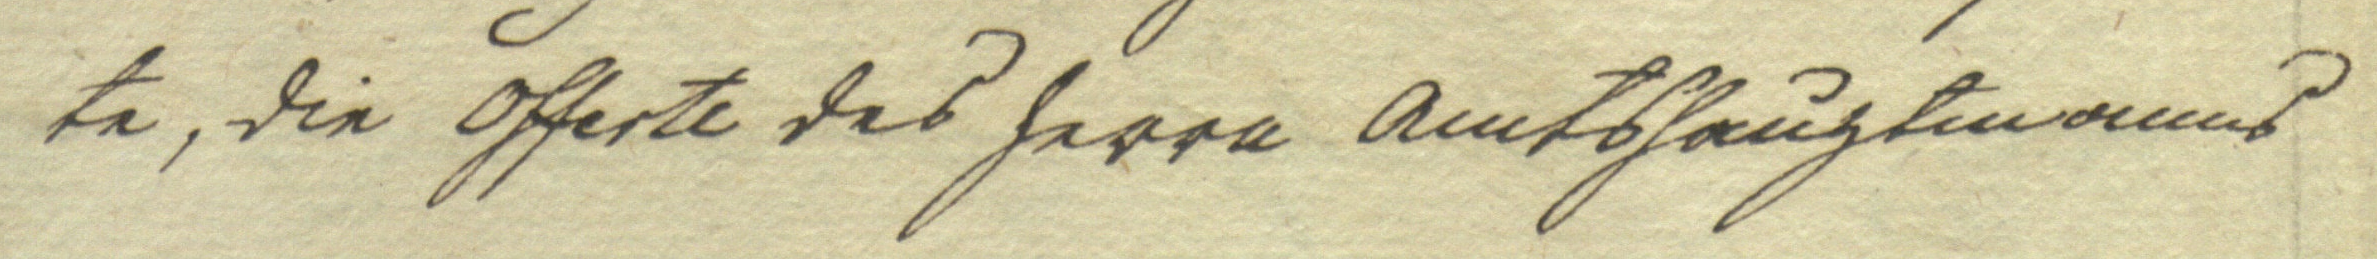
te, die Offerte des Herrn Amtshauptmanns
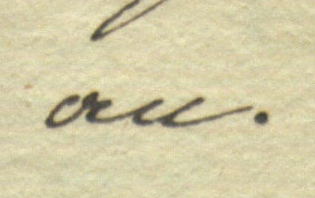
an¬
